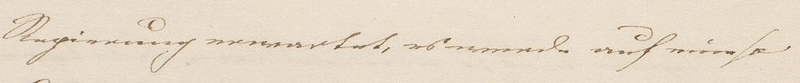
Regierung erwartet, es werde auf eine so
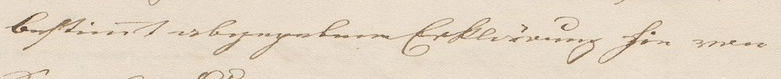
bestimmt abgegebene Erklärung hin von
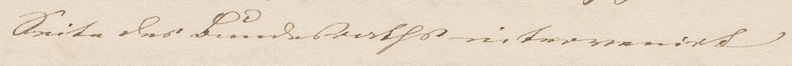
Seite des Bundesraths intervenirt
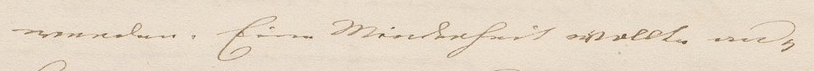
werden. Eine Minderheit wollte an-
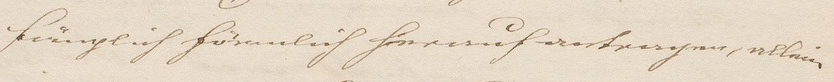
fänglich förmlich hierauf antragen, allein
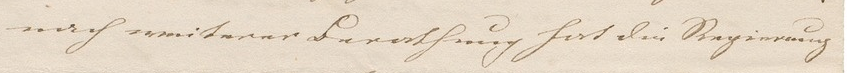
nach weiterer Berathung hat die Regierung
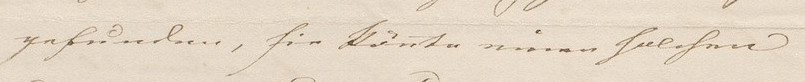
gefunden, sie könnte einen solchen
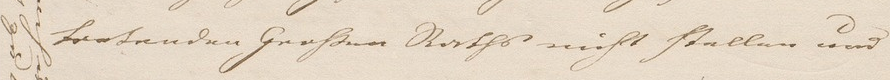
tretenden Großen Raths nicht stellen und
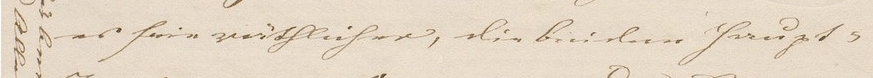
es seie räthlicher, die beiden Haupt-
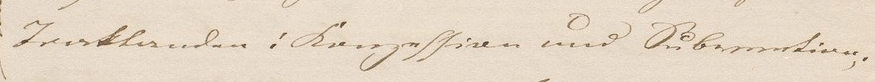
Traktanden: Konzession und Subvention
